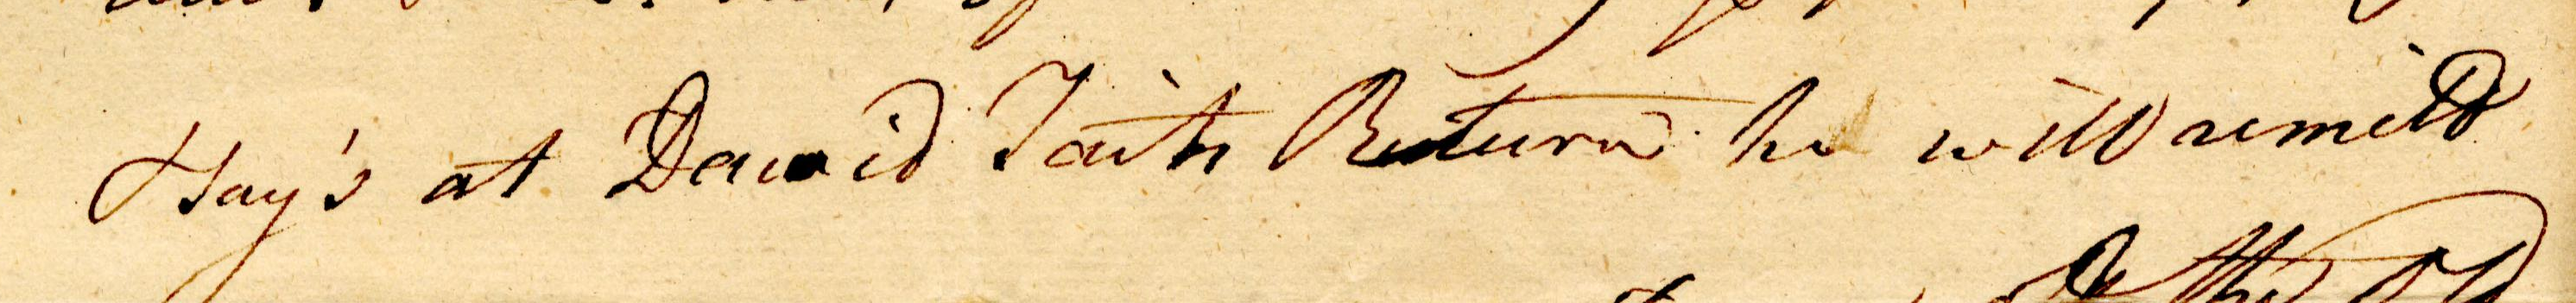Hay's at David Taits Return he will remitd
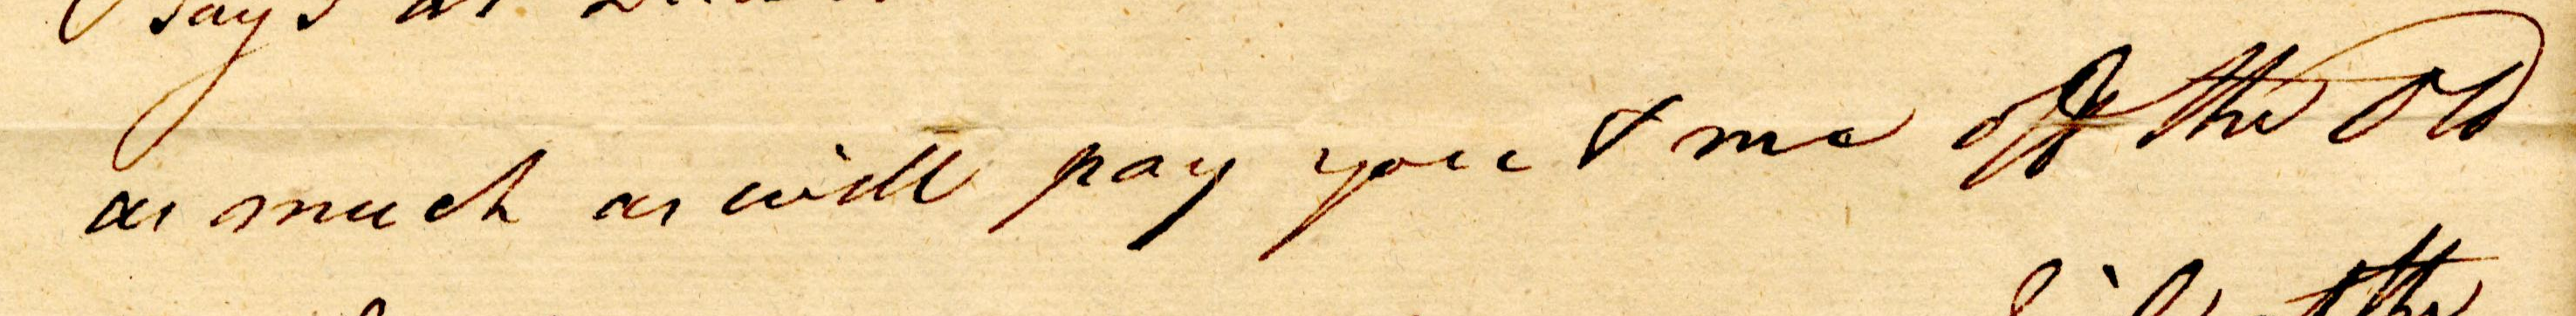as much as will pay you & me off the old
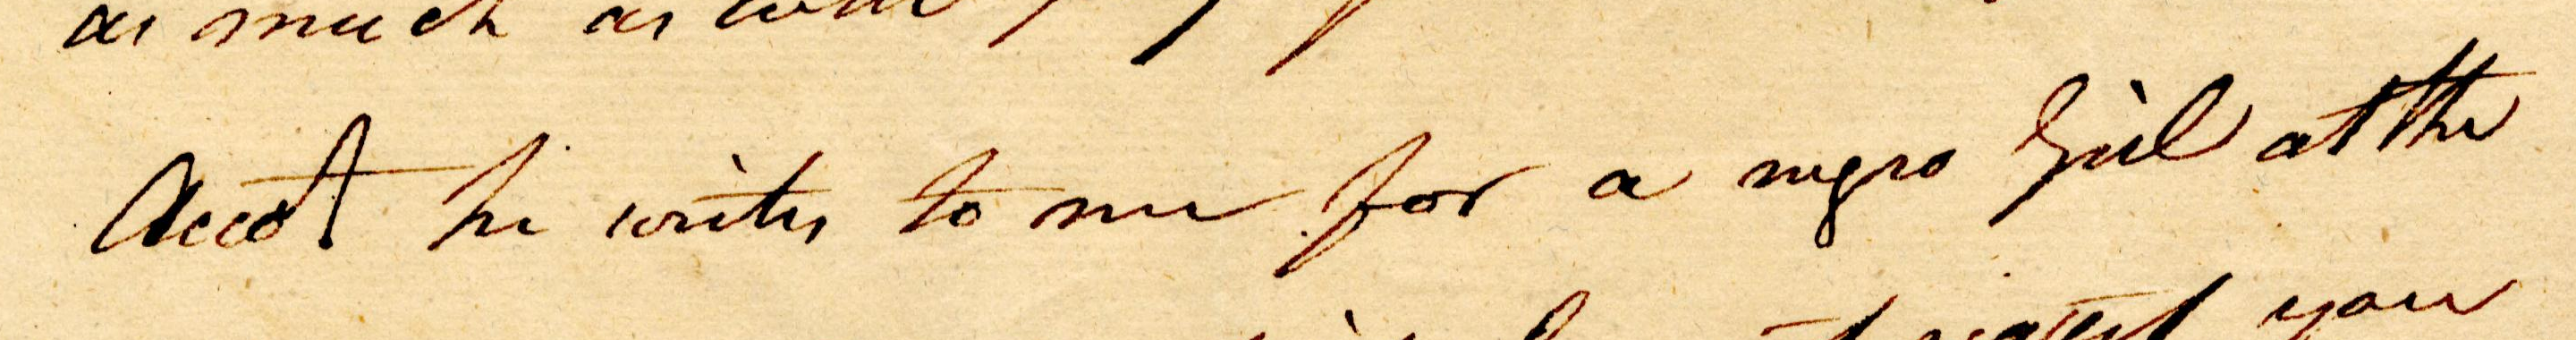Acco^t he writes to me for a negro Girl at the
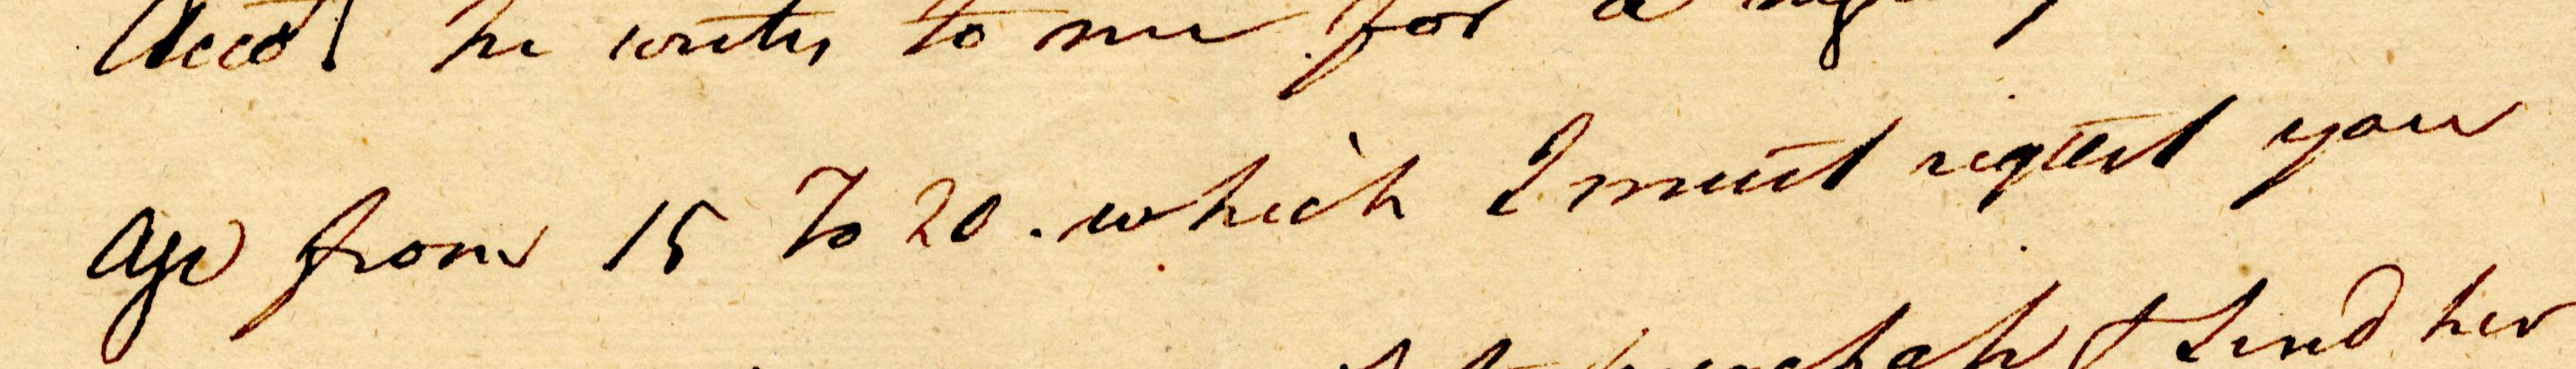age from 15 to 20. which I must requst you
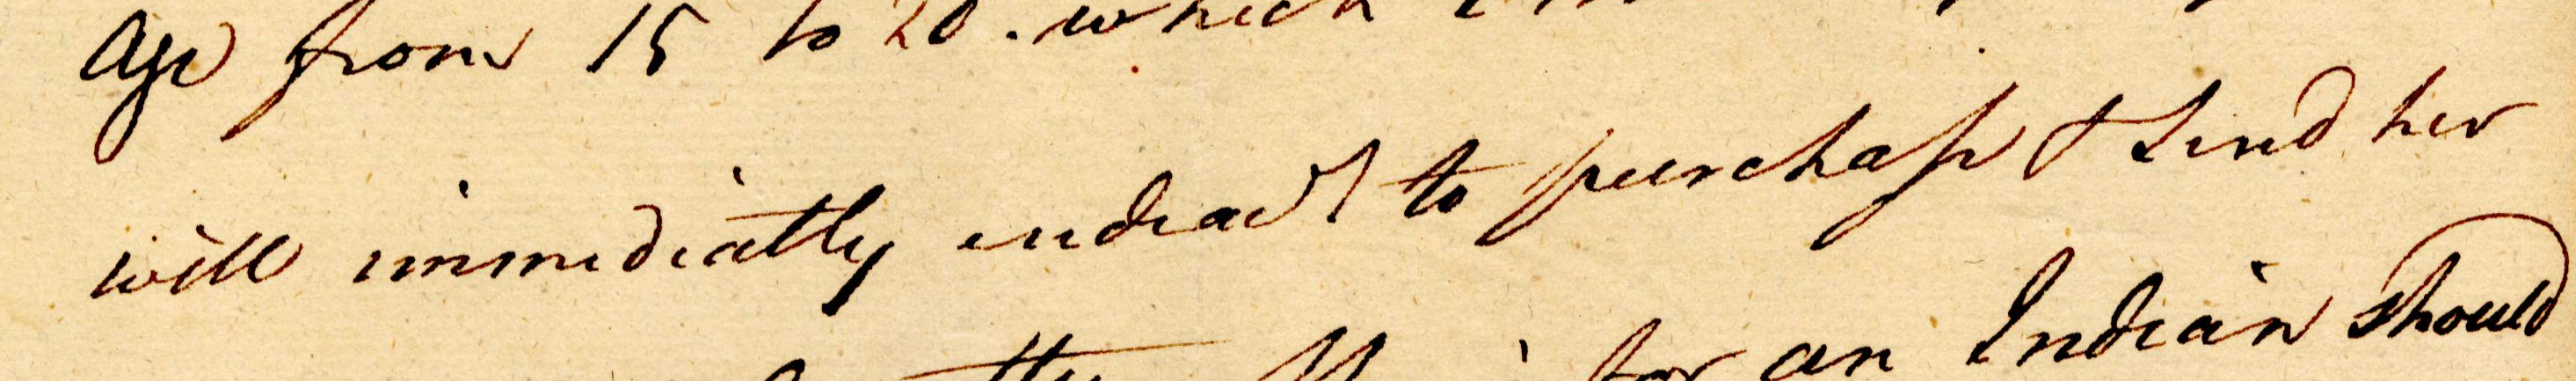will immediately endraft to purchase & Send her
